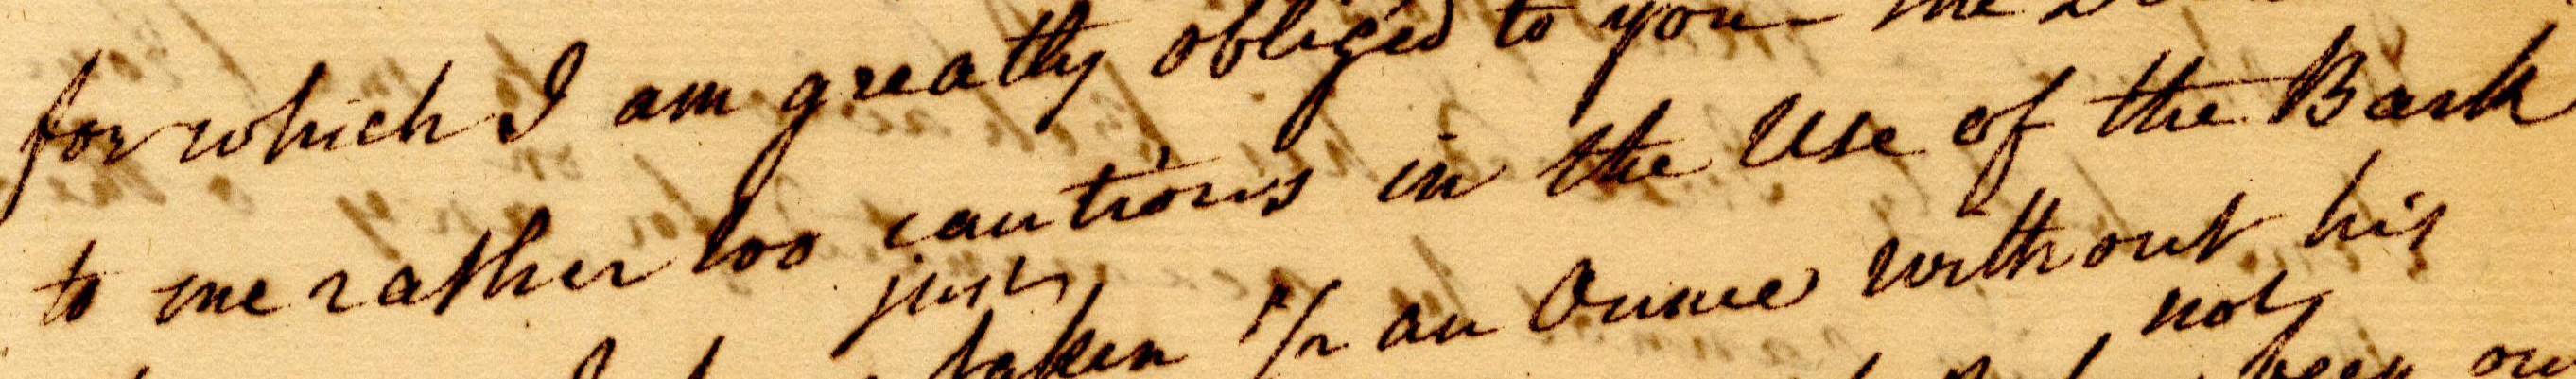to me rather too cautions in the Use of the Bark
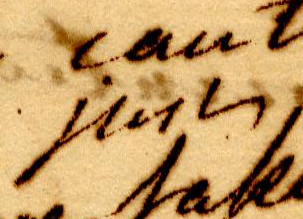just
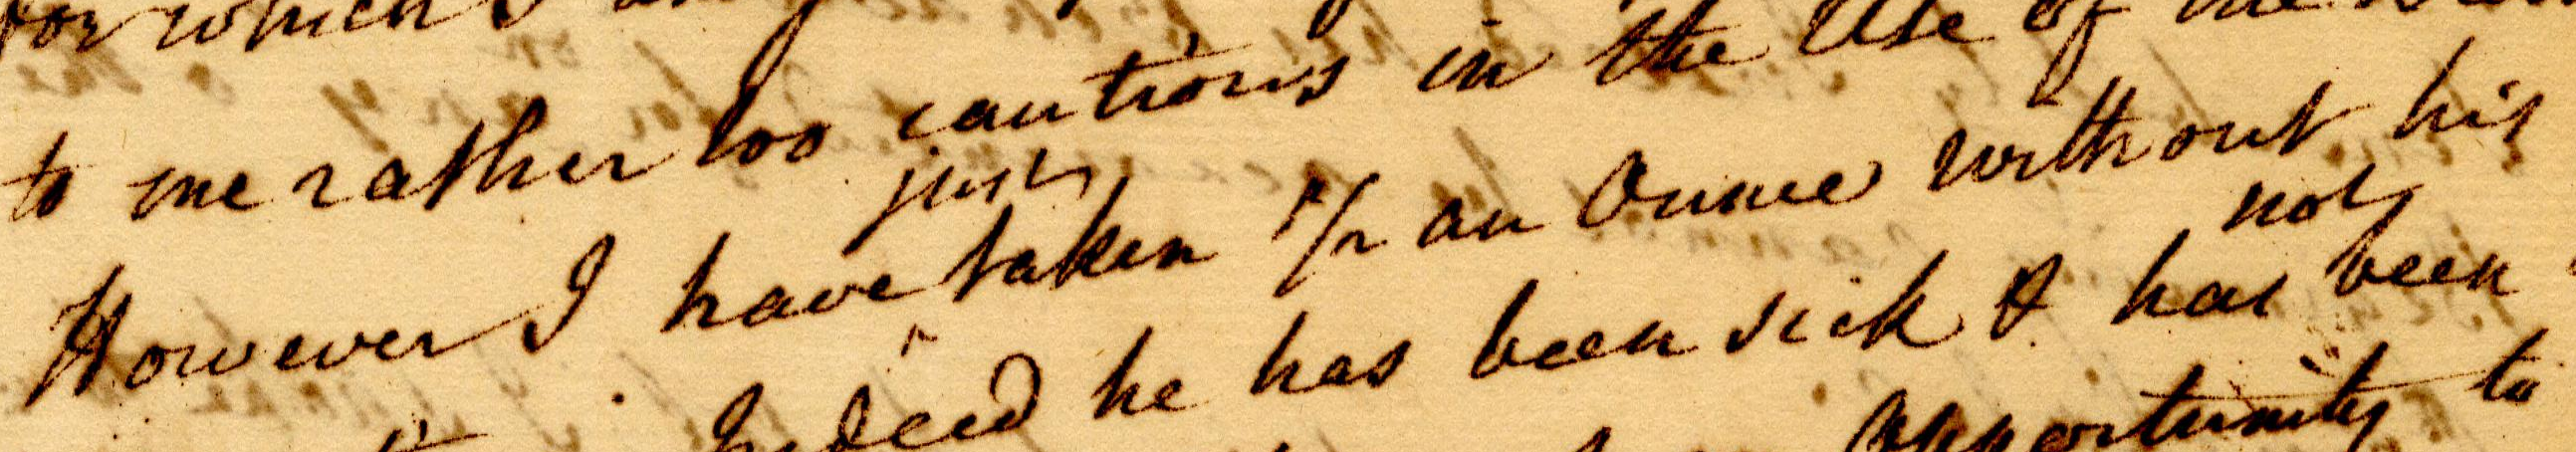However I have ^ taken 1/2 an Ounce without his
